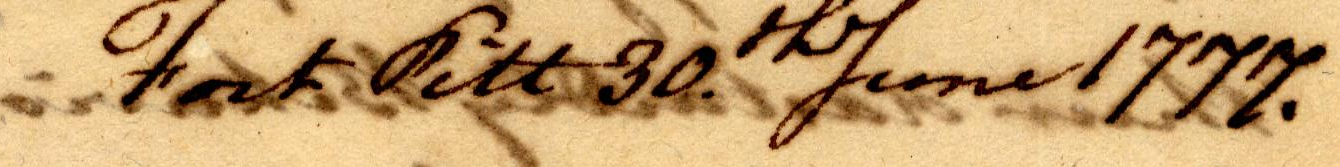Fort Pitt 30^th. June 1777.
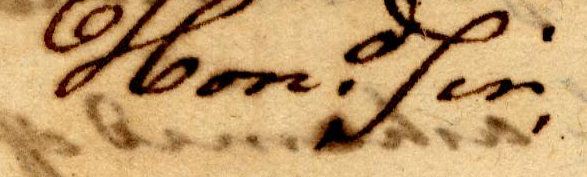Hon. Sir,
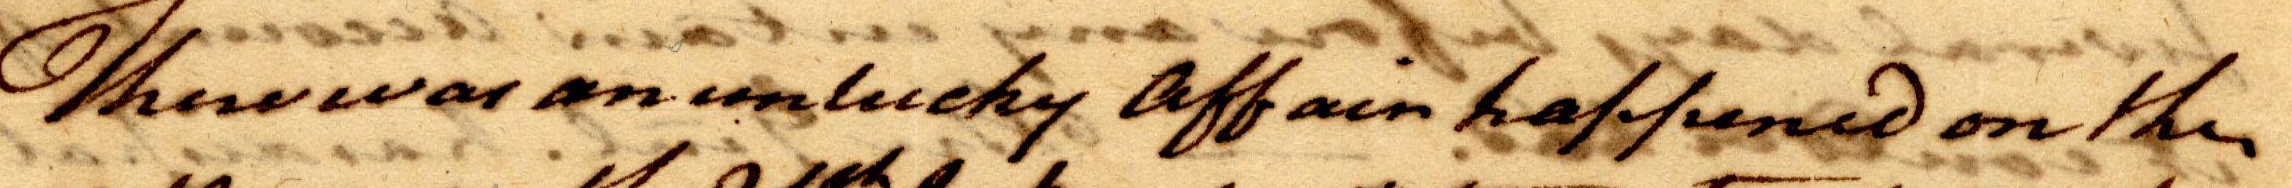There was an unlucky affair happened on the
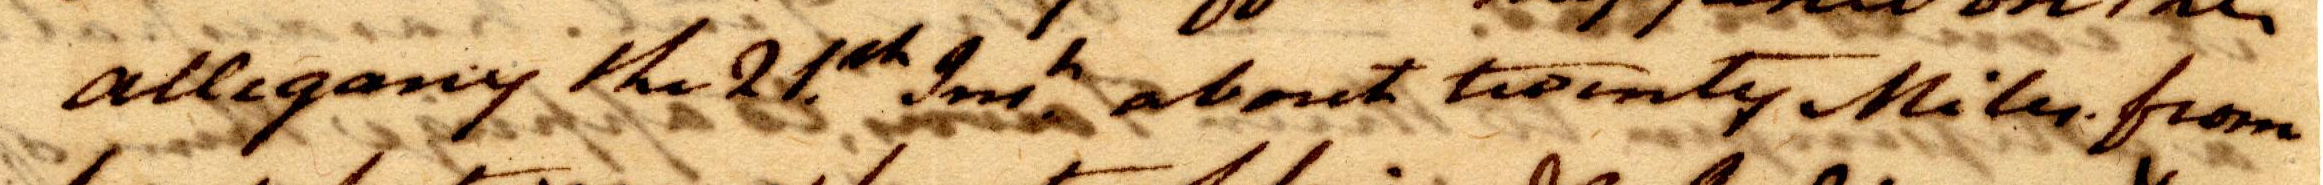Allegany the 21.^st Ins^t. about twenty Miles from
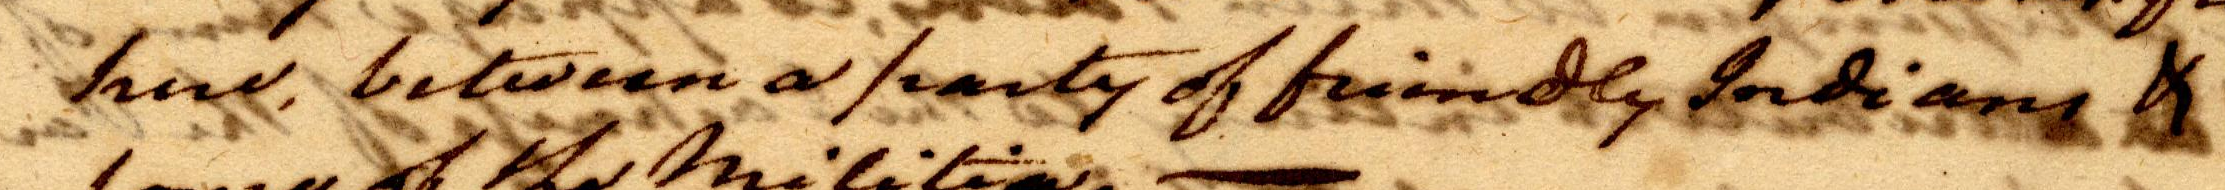here, between a party of friendly Indians &
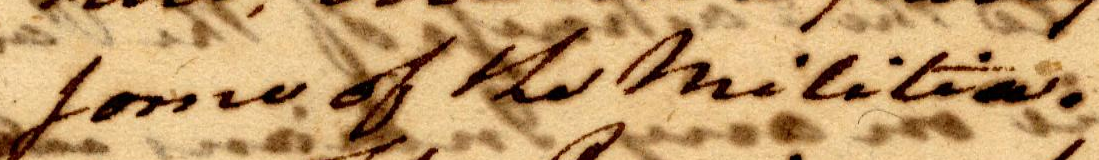some of the Militia.
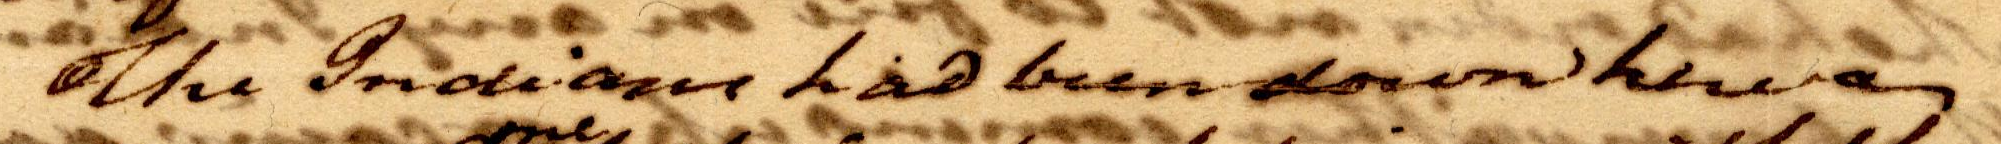The Indians had been down here a
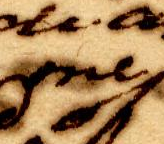one
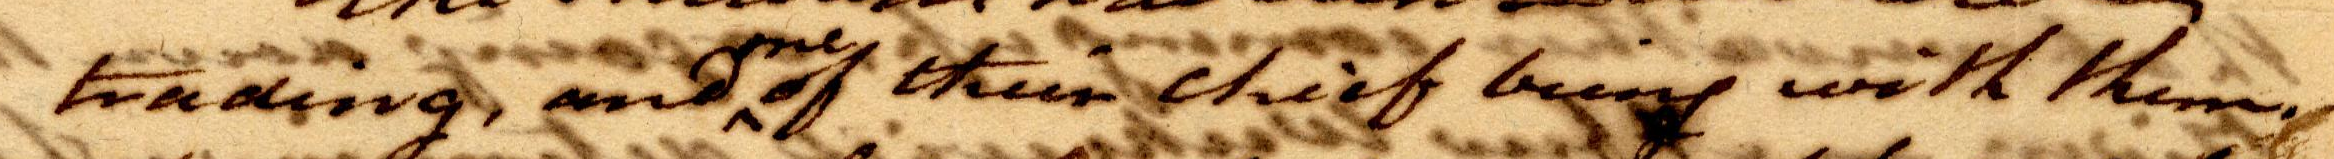trading, and ^ of their chief being with them,
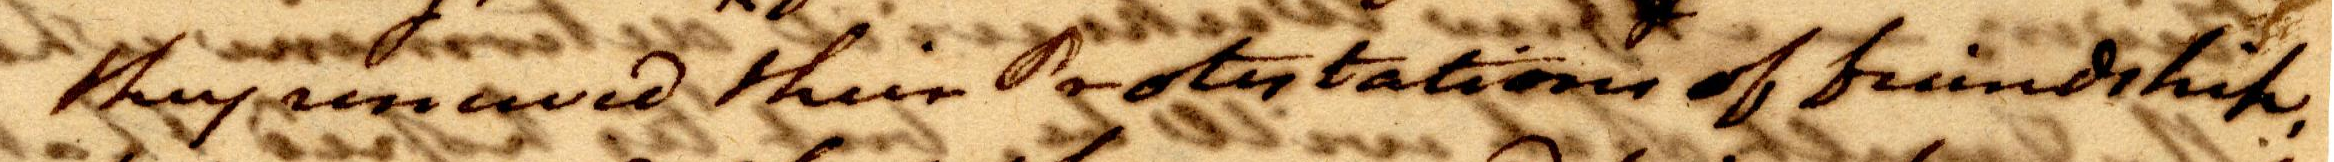they renewed their Protestations of Friendship,
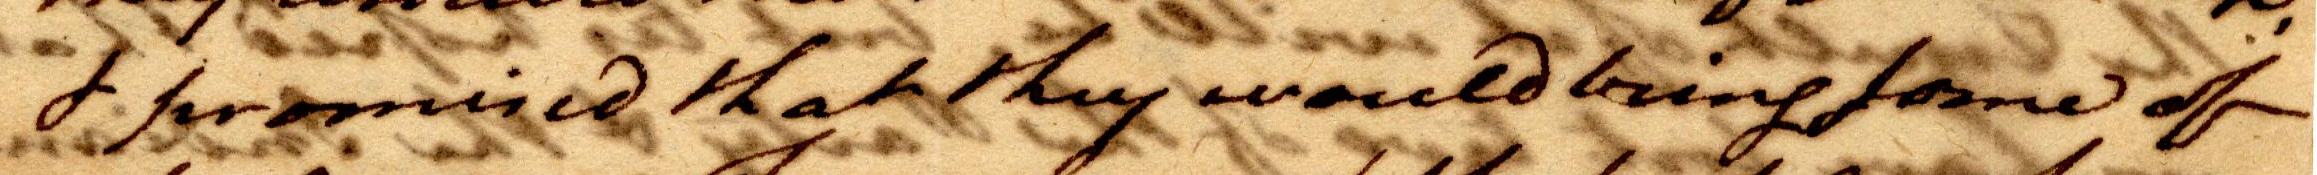& promised that they would bring some of
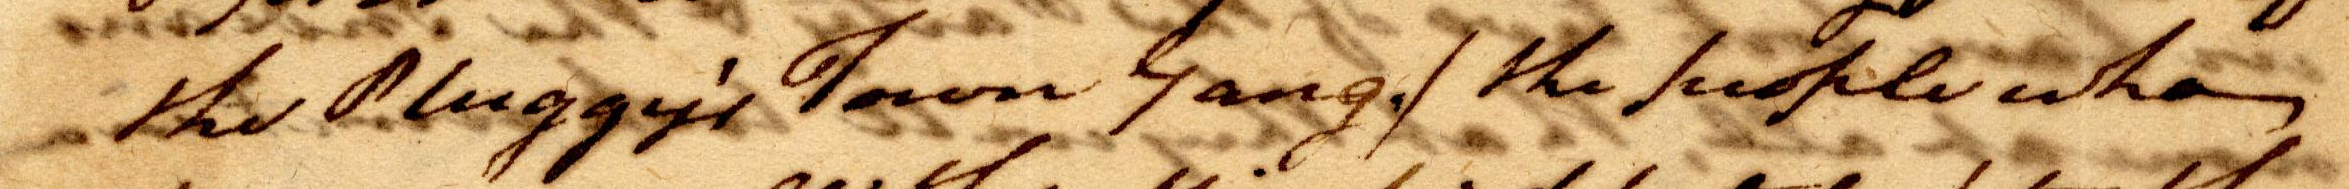the Pluggy's Town Gang, (the people who
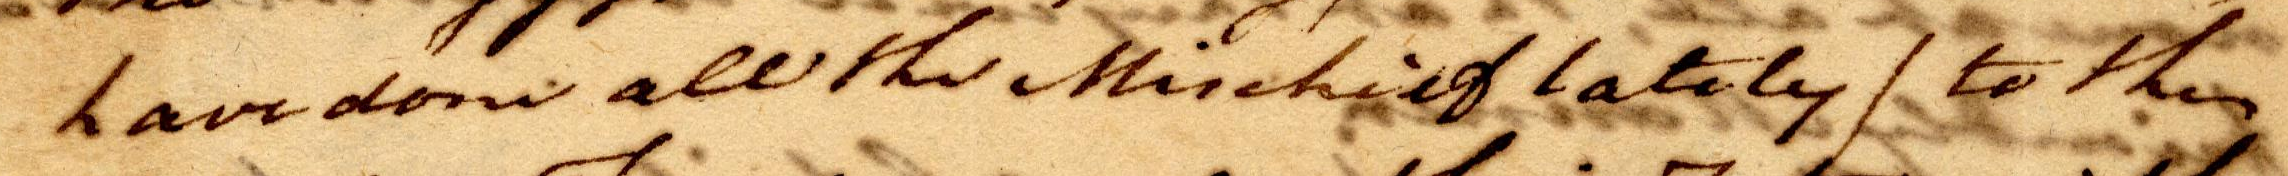have done all the Mischief lately) to the
